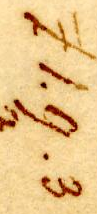£1.9.3
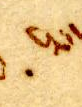5.
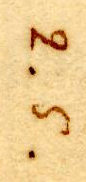2.5.
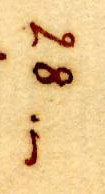28.-
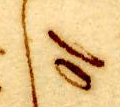10
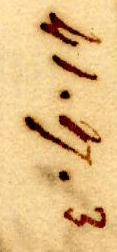41.17.3
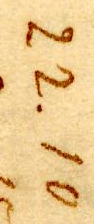22. 10
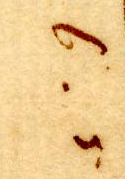6.5
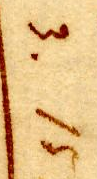3. 15
